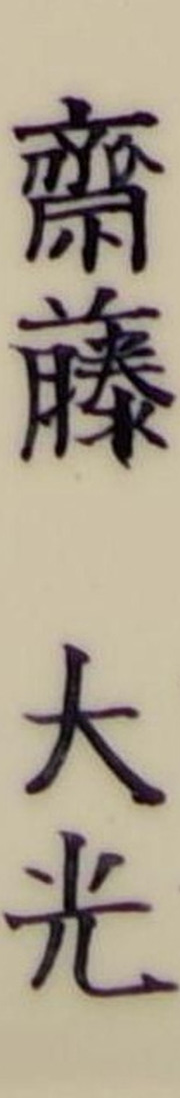齋藤大光
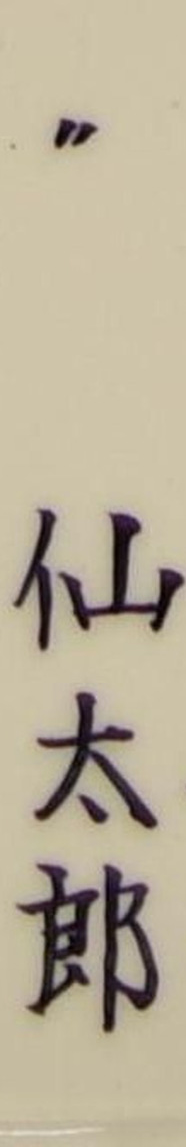仙太郎
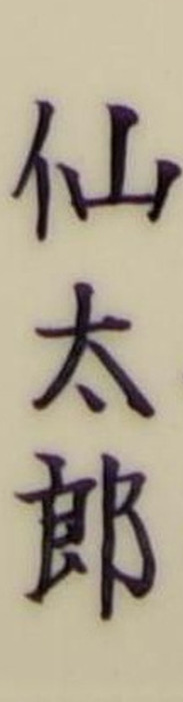仙太郎
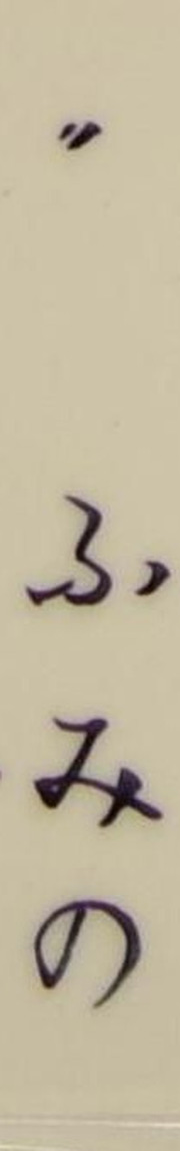ふみの
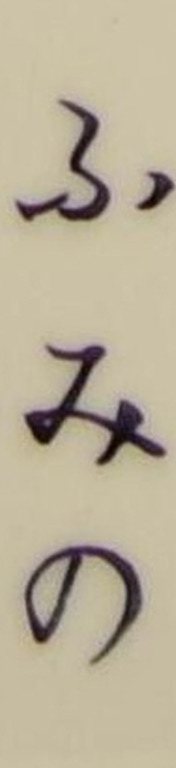ふみの
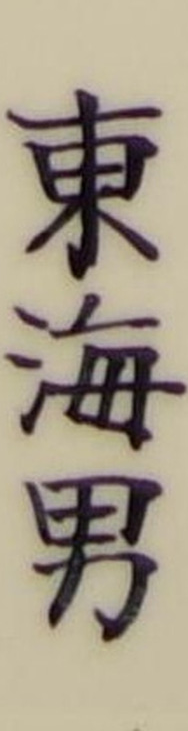東海男
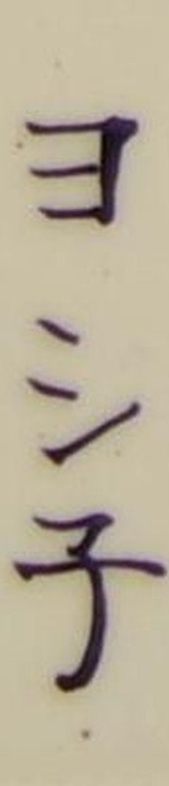ヨシ子
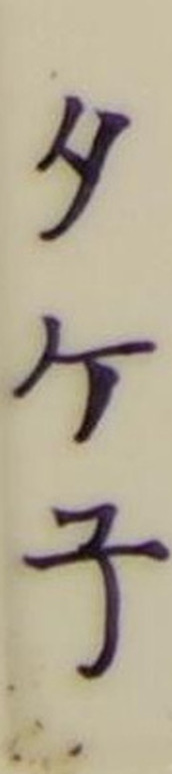タケ子

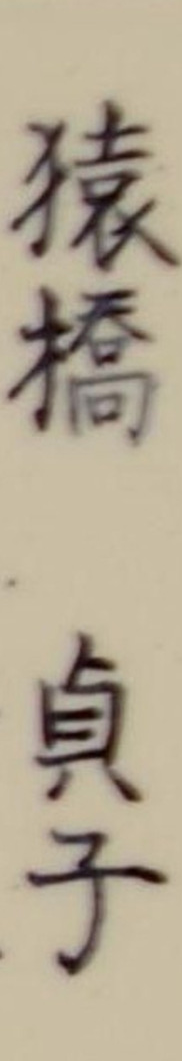猿橋貞子
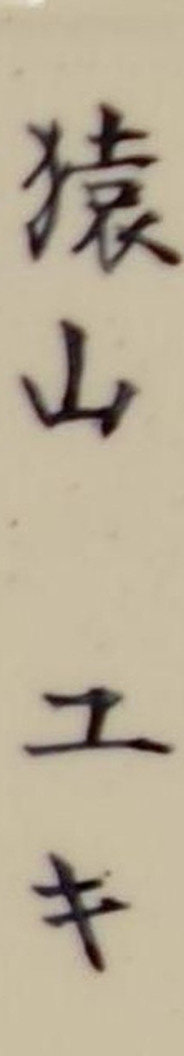猿山ユキ
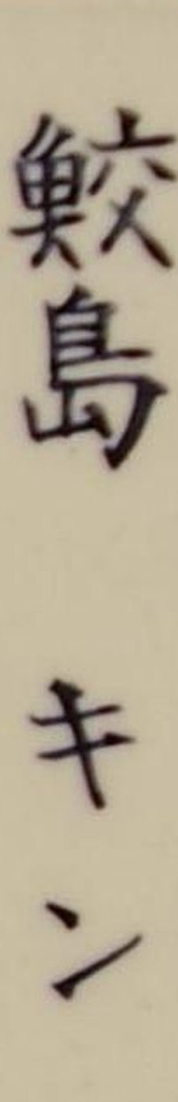鮫島キン
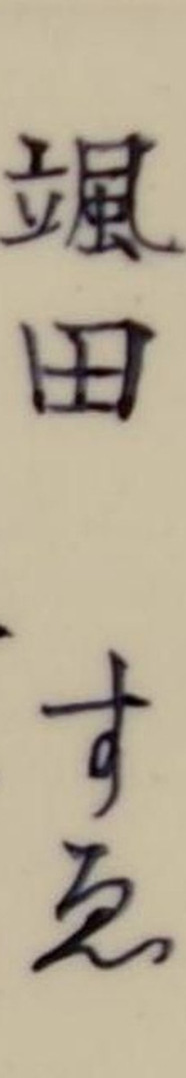颯田すゑ
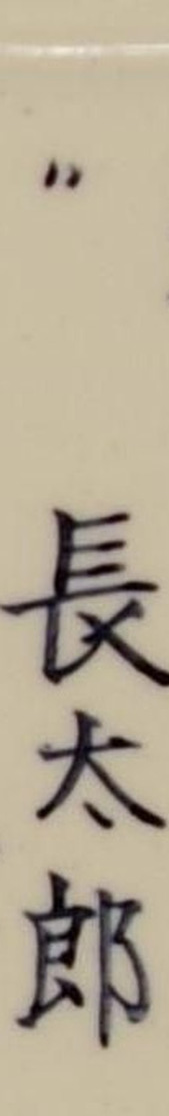長太郎
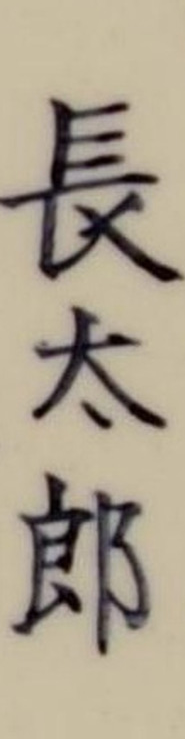長太郎
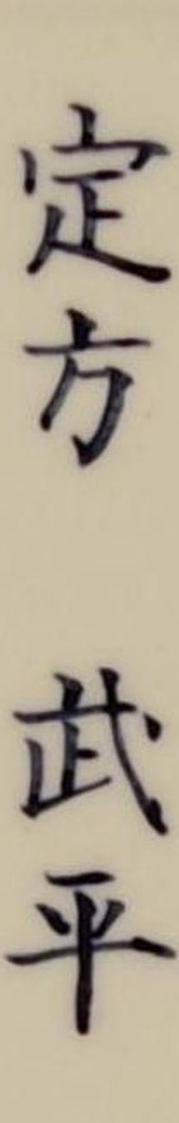定方武平
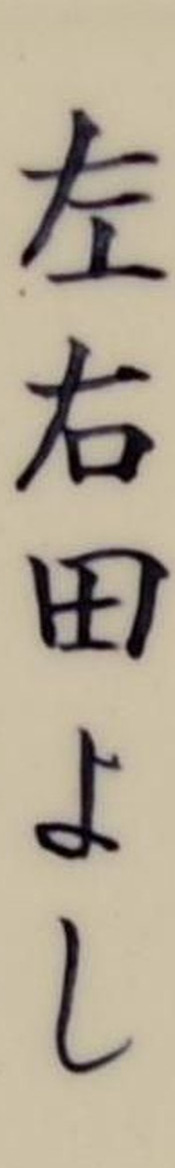左右田よし
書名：E~L
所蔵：高野山金剛峯寺
